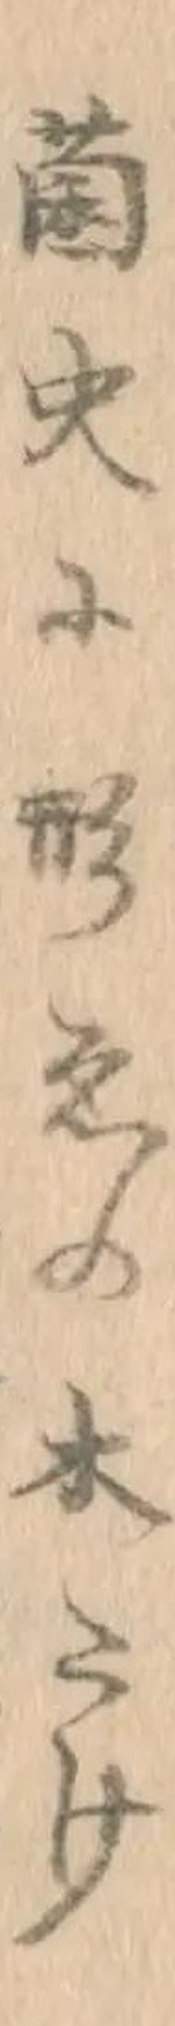菌史に形ゑの木たけ
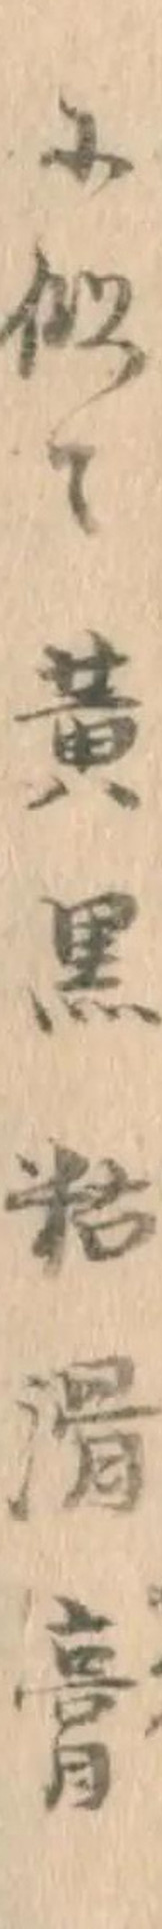に似て黄黒粘滑膏
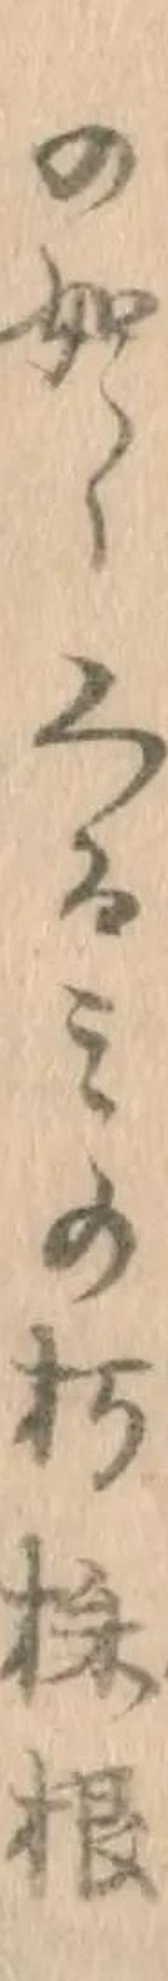の如くくるみの朽株根
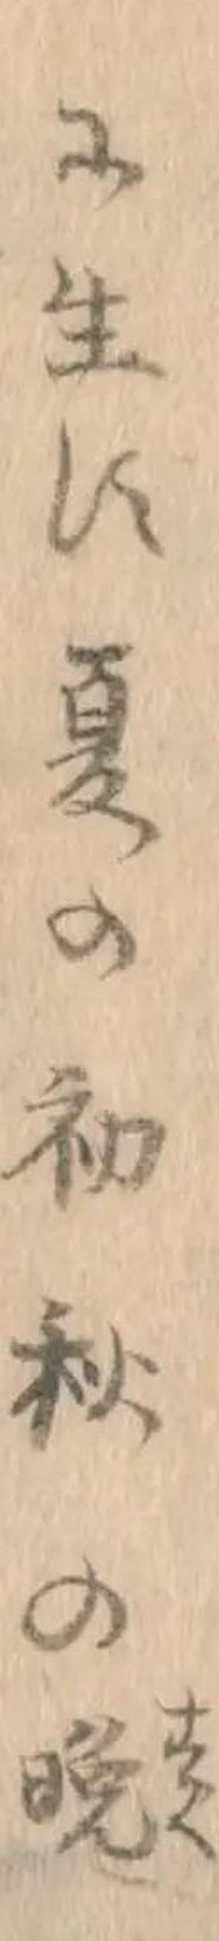に生す夏の初秋の晩
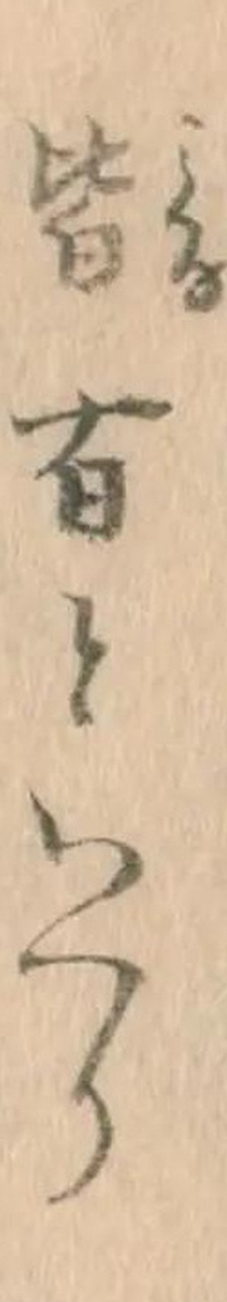皆有といへり
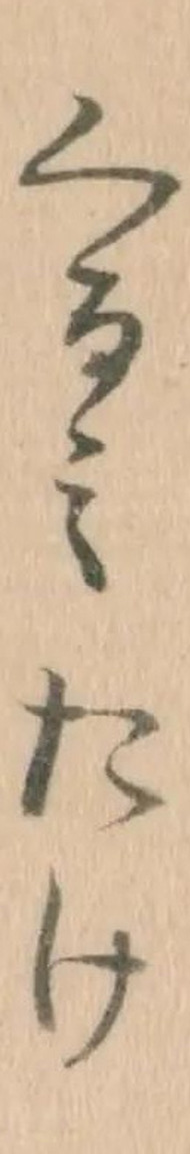くるみたけ
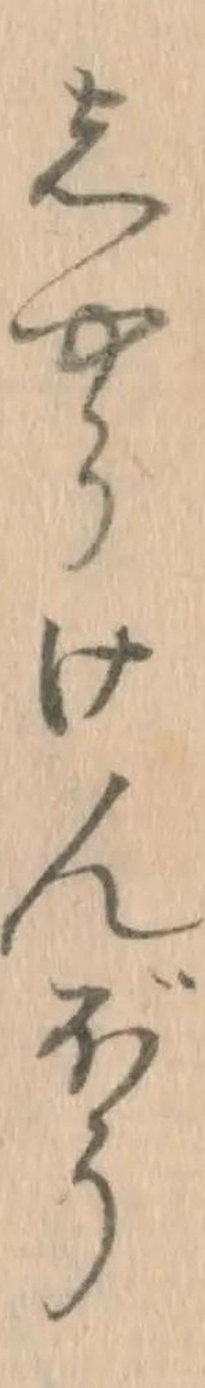しやうけんぼう
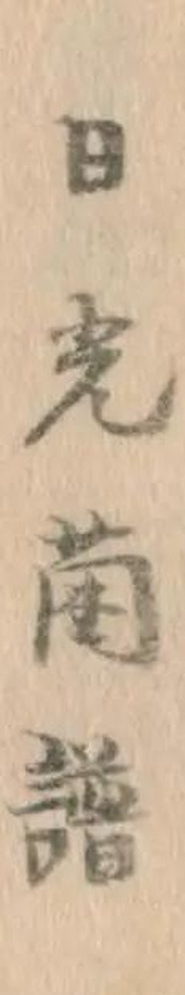日光菌譜
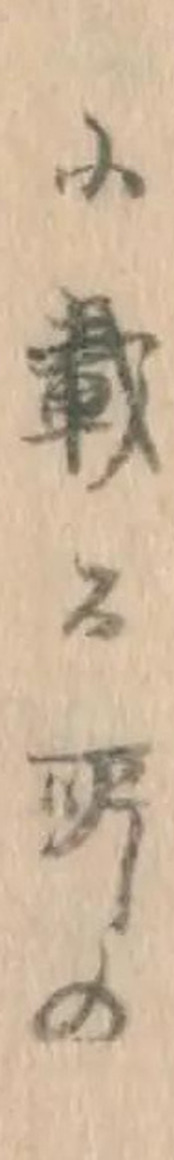に載る所の

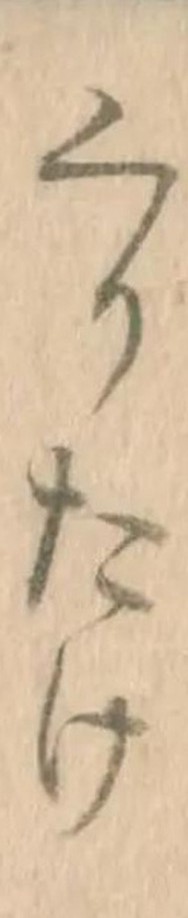くりたけ
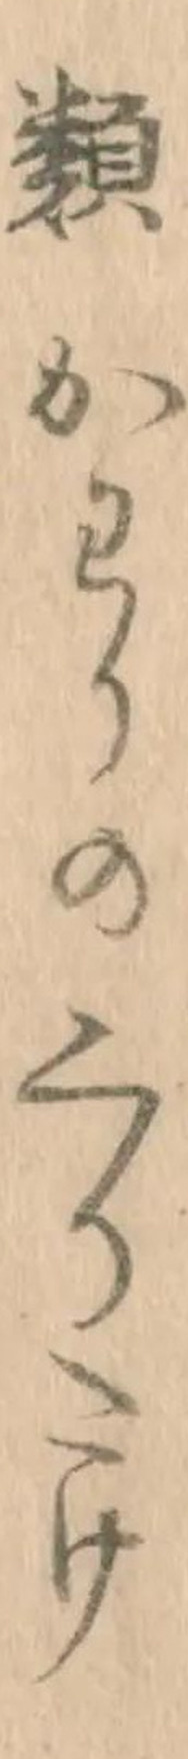類かわりのくりたけ
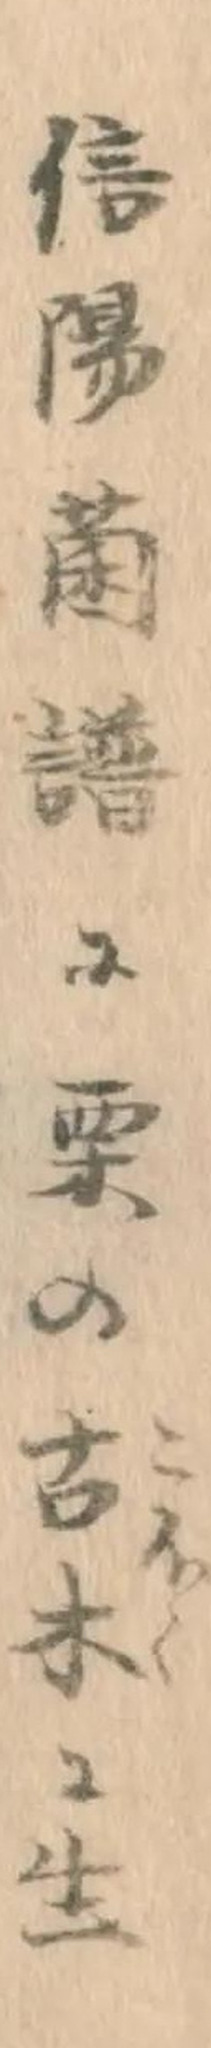信陽菌譜に栗の古木に生
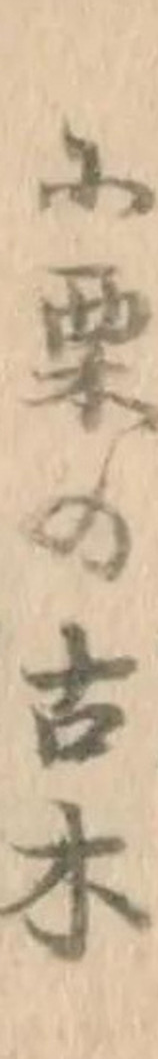に栗の古木
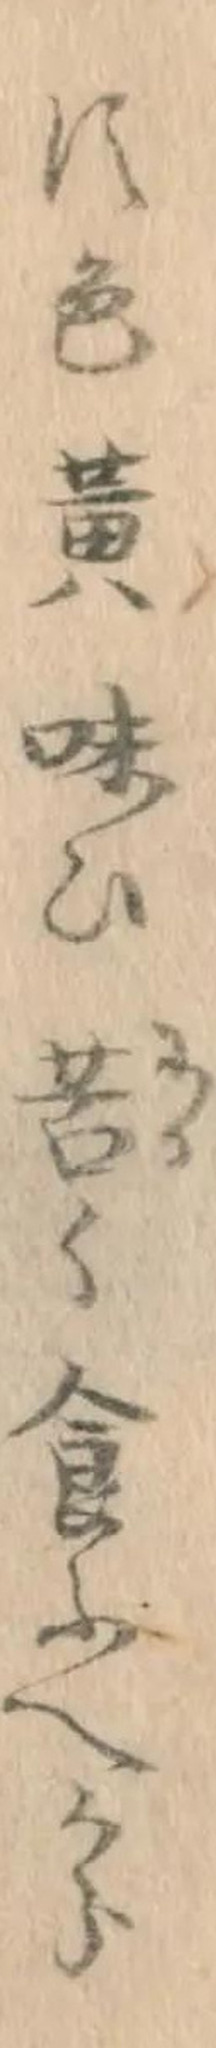す色黄味ひ苦く食ふへから
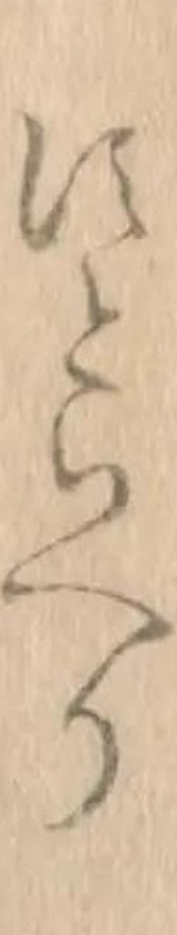すといへり
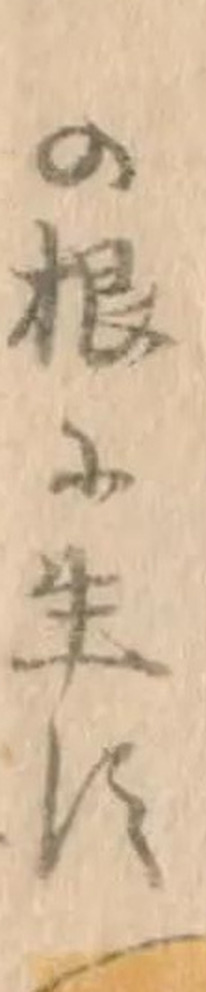の根に生す
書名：本草図譜. 巻55-57
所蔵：国立国会図書館 National Diet Library, JAPAN
